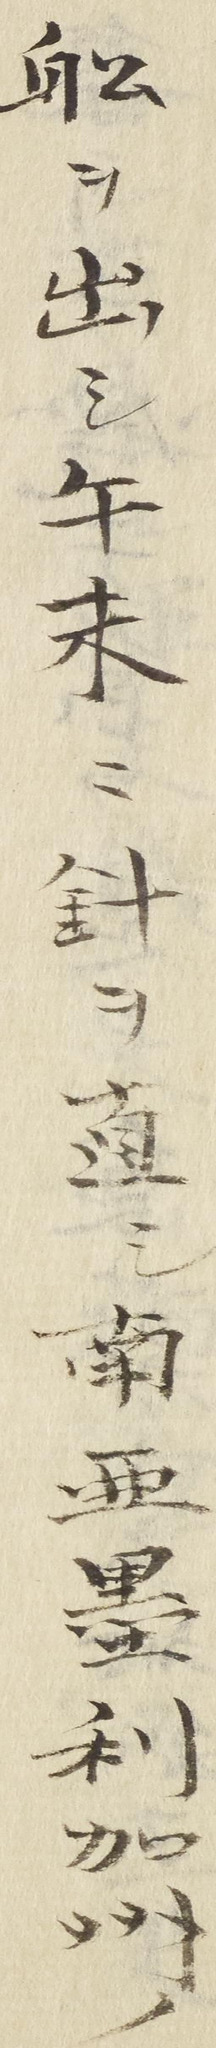船ヲ出シ午未ニ針ヲ直シ南亜墨利加州ノ
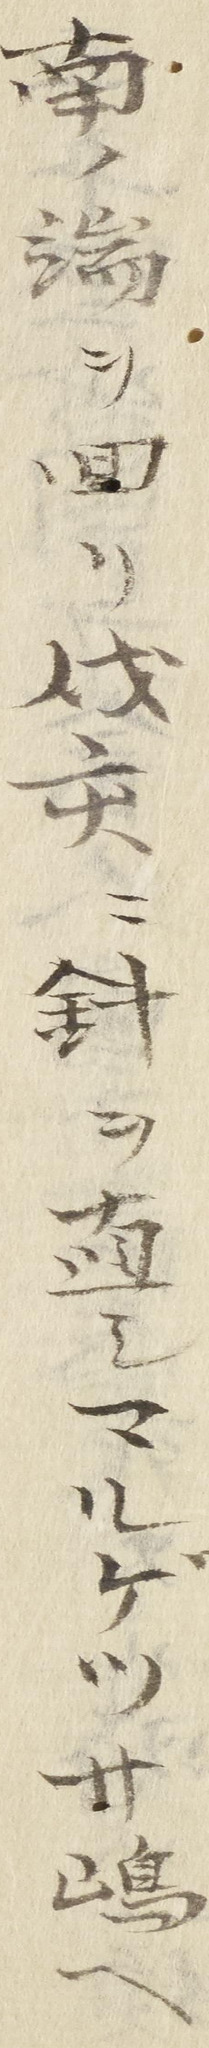南ノ端ヲ回リ戌亥ニ針ヲ直シマルゲツサ島ヘ
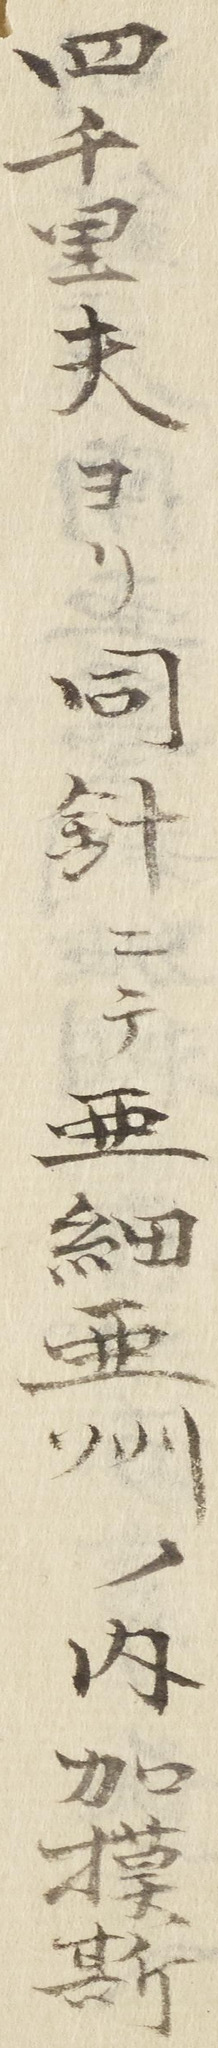四千里夫ヨリ同針ニテ亜細亜州ノ内加模斯
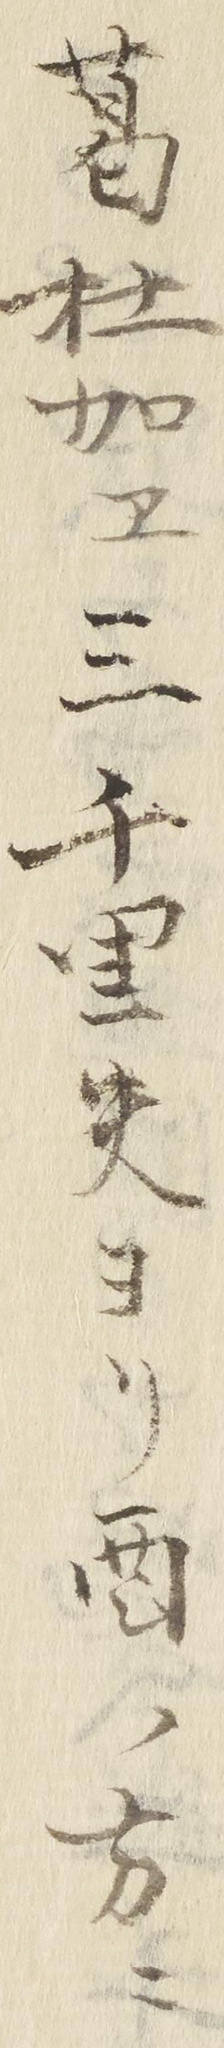葛杜加ヱ三千里夫ヨリ酉ノ方ニ
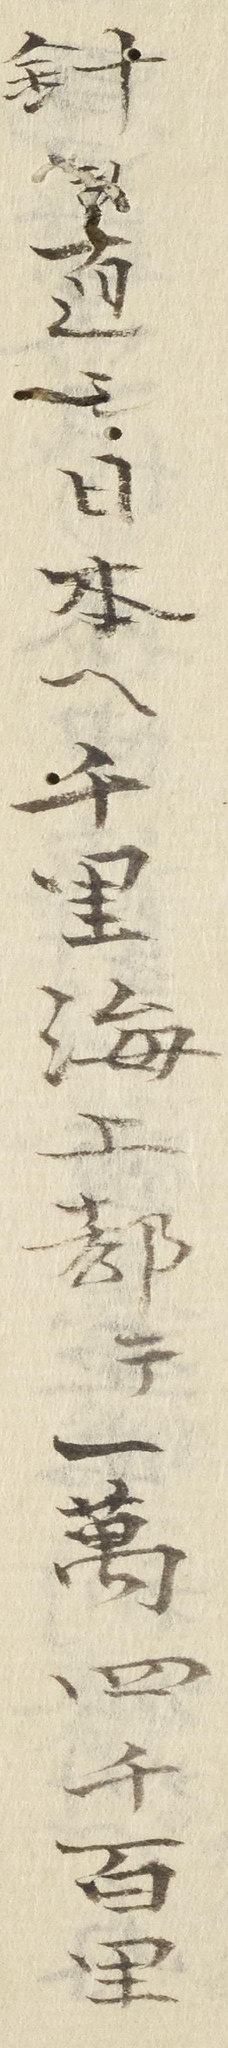針ヲ？直シ日本ヘ千里海上都テ一万四千百里
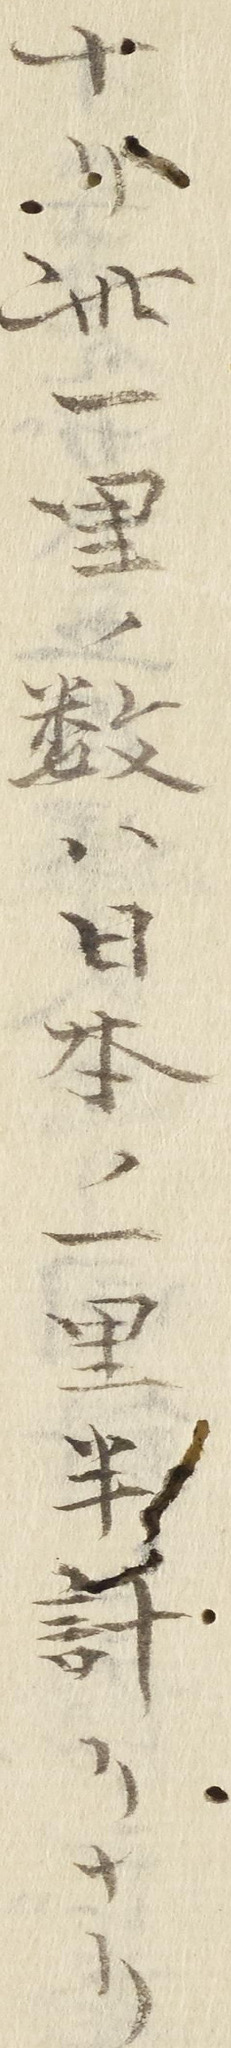ナリ此一里ノ数ハ日本ノ一里半計リナリ
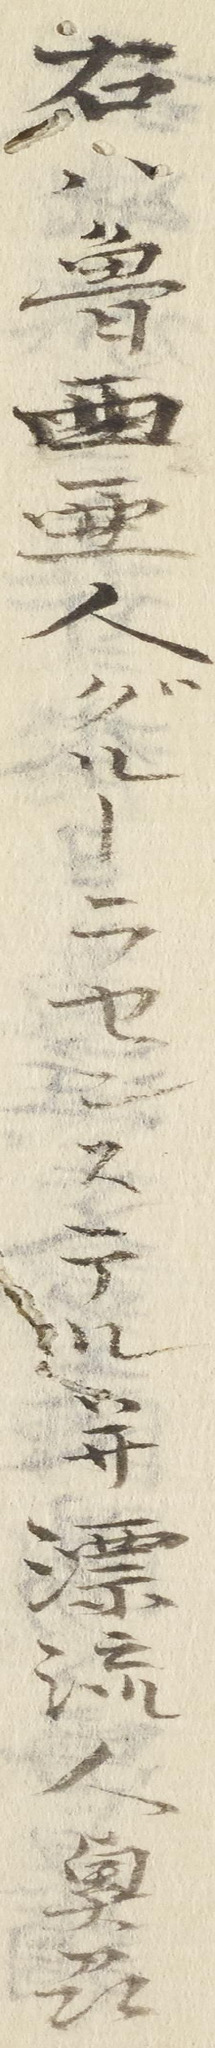右ハ魯西亜人グルーラセンステル幷漂流人奥州
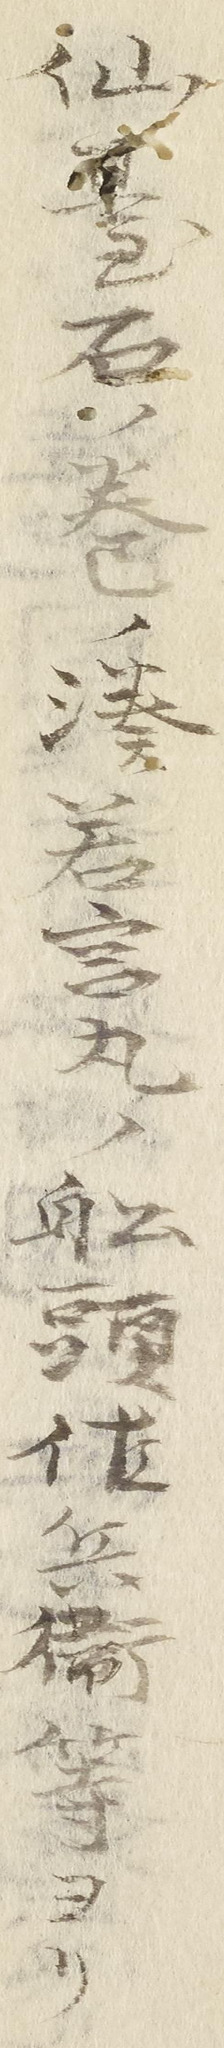仙台石ノ巻ノ湊若宮丸ノ船頭佐兵衛等ヨリ
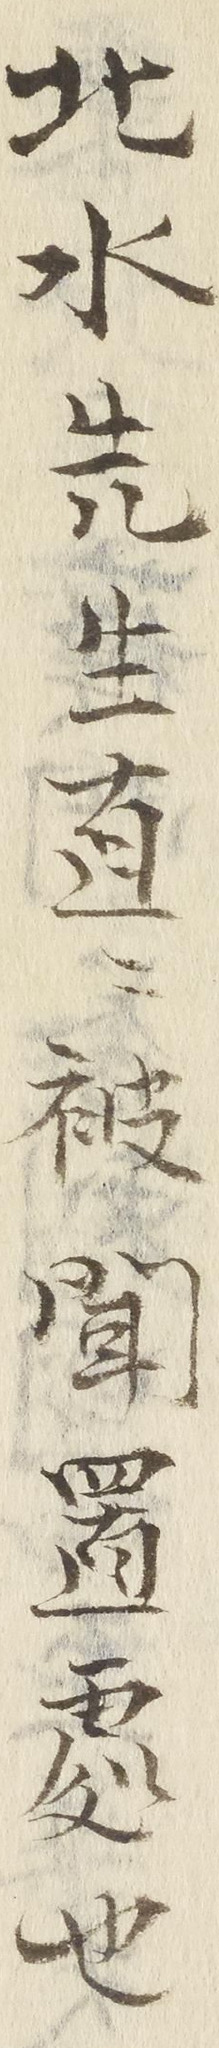北水先生直ニ被聞置処也
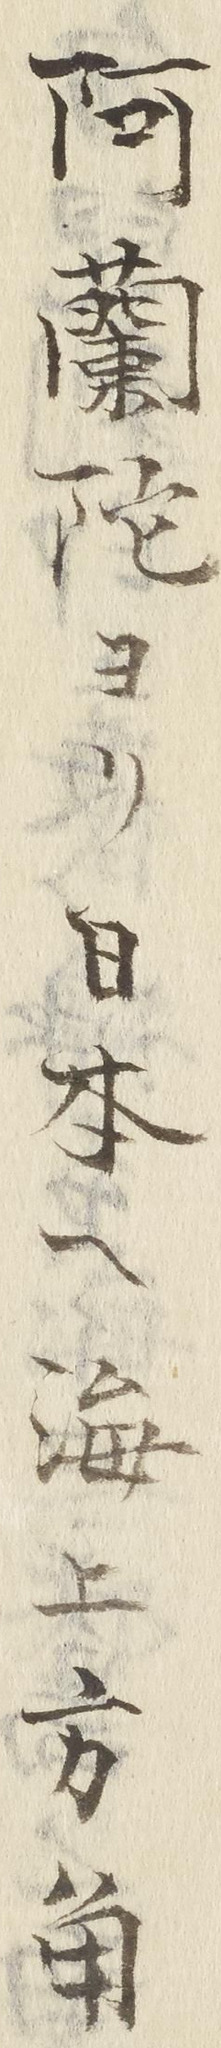阿蘭陀ヨリ日本ヘ海上方角
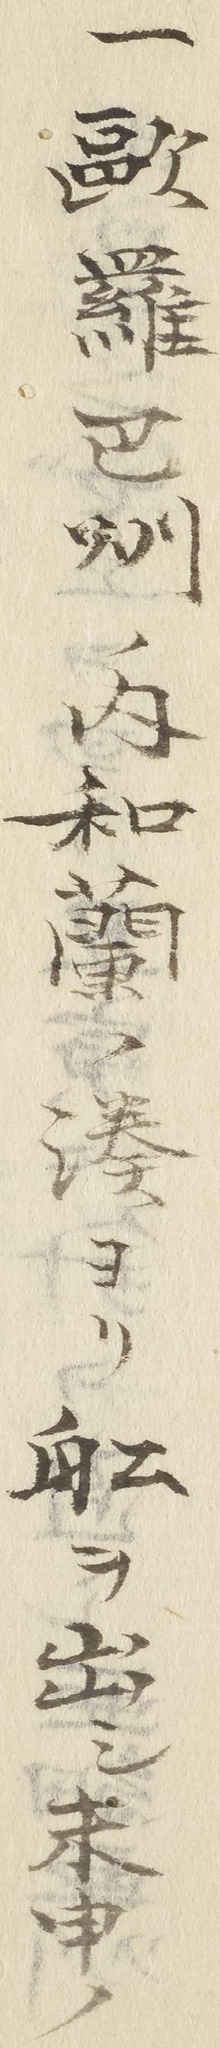一欧羅巴州ノ内和蘭ノ湊ヨリ船ヲ出シ未申ノ

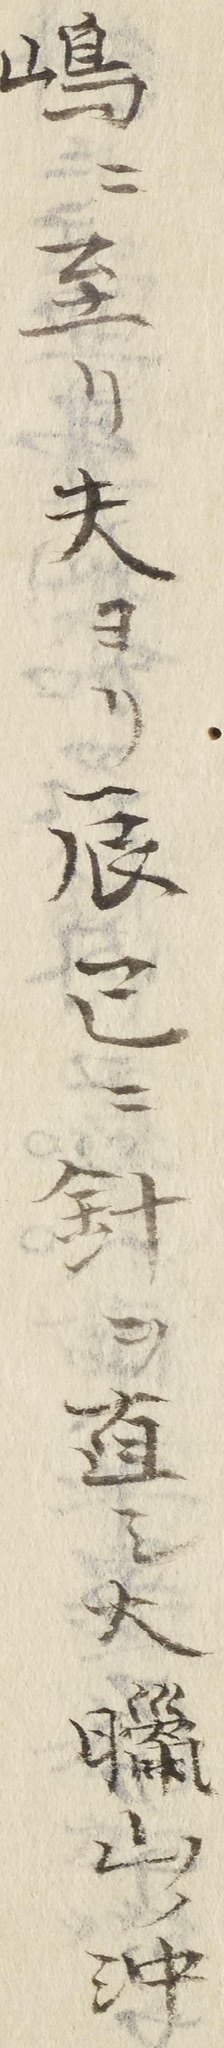島ニ至リ夫ヨリ辰巳ニ針ヲ直シ大臘山ノ沖
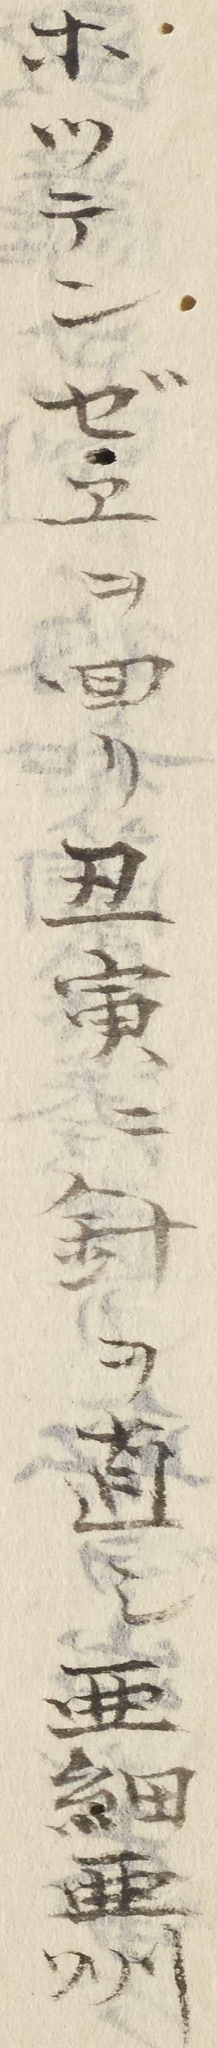ホツテンゼヱヲ回リ丑寅ニ針ヲ直シ亜細亜州
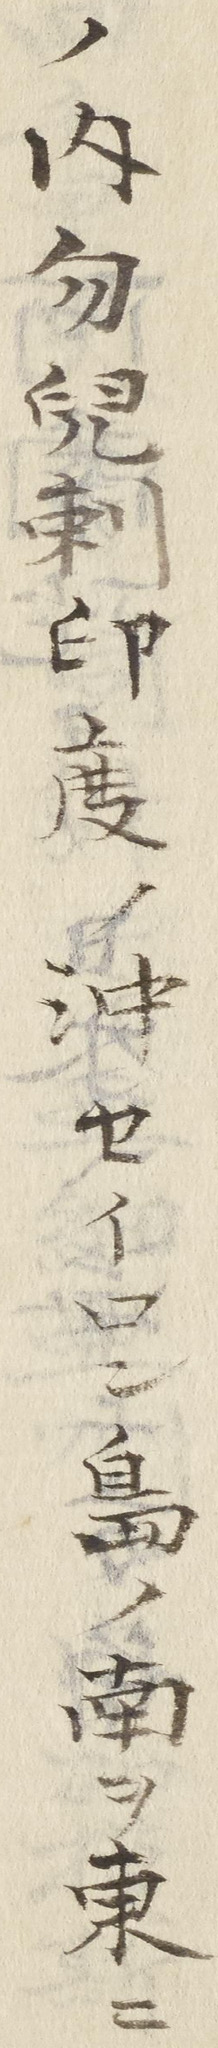ノ内勿兒刺印度ノ沖セイロン島ノ南ヲ東ニ
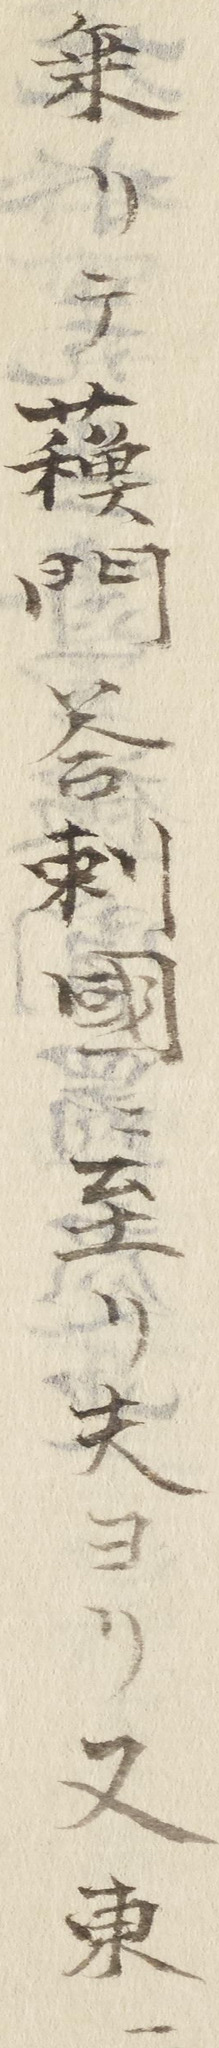乗リテ蘓門荅刺国ニ至リ夫ヨリ又東ニ
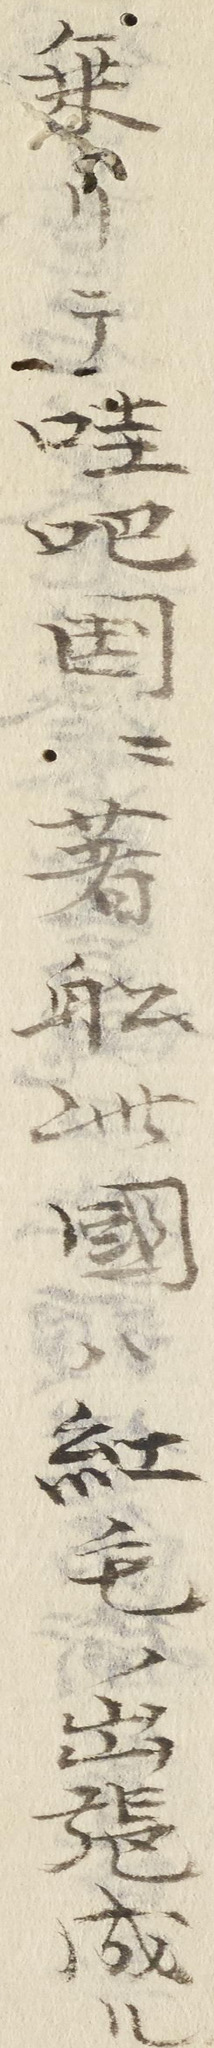乗リテ哇吧国ニ着船此国ハ紅毛ノ出張成ル
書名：天象話説
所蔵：東京大学地震研究所図書室 Earthquake Research Institute Library, The University of Tokyo, JAPAN
